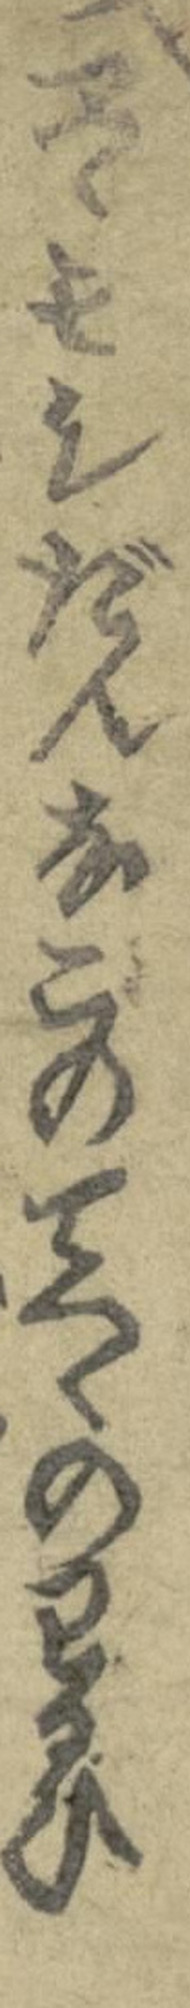〽エヽモシだんなこのてへくのわるひ
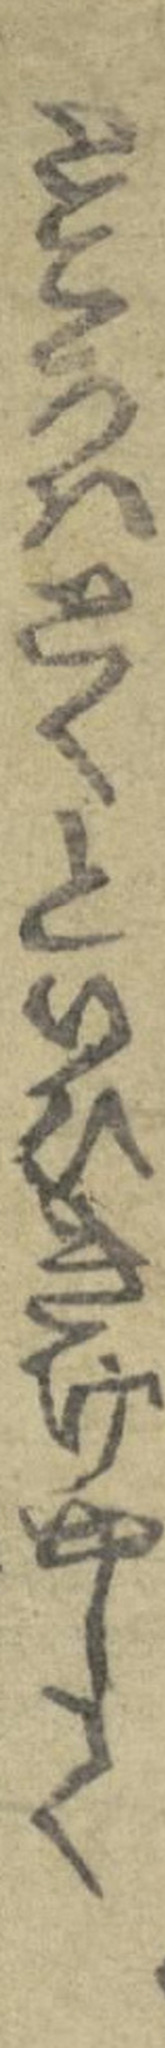ところはとくといひきけやして
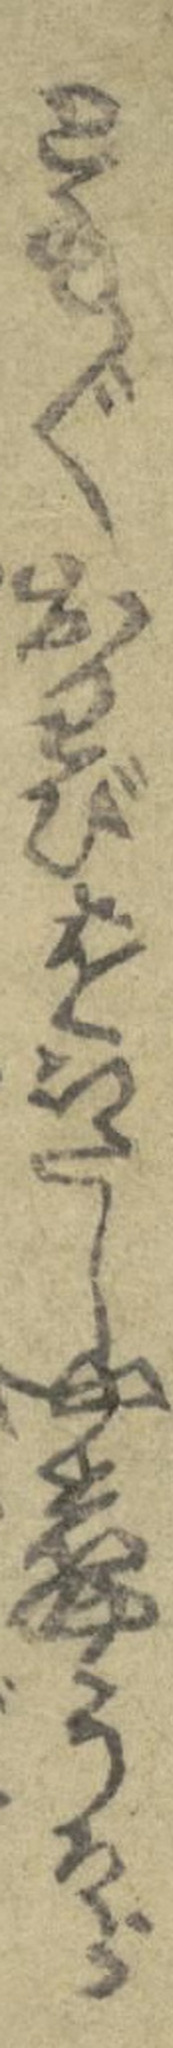とも〴〵おわびをいたしやしやうから
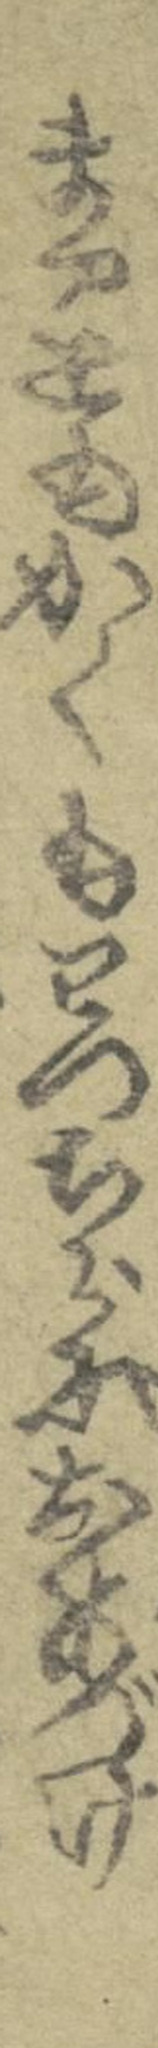まアともかくもわつちらにおあづけ
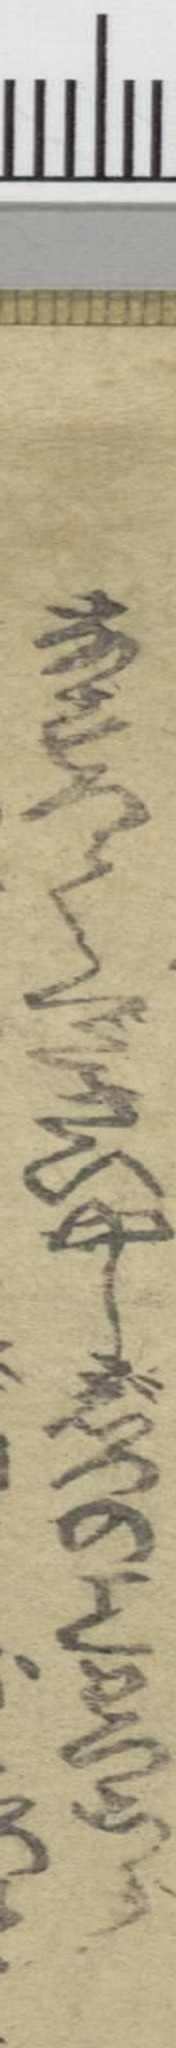なすつてくださいやしじつのことわつちら
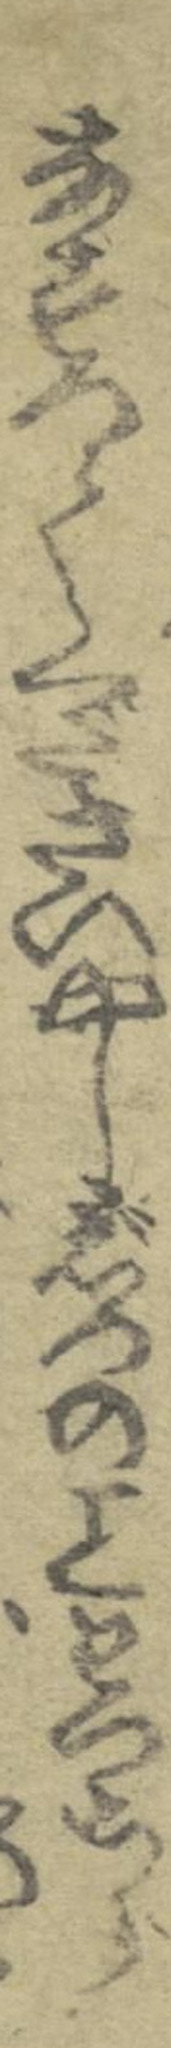なすつてくださいやしじつのことわつちら
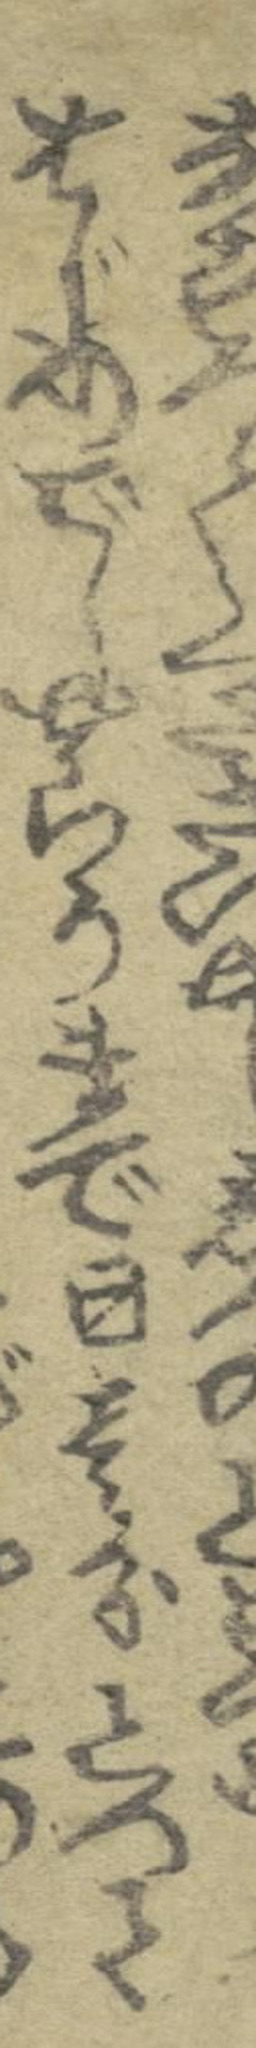はじめでしやらうまで日壱分とつて
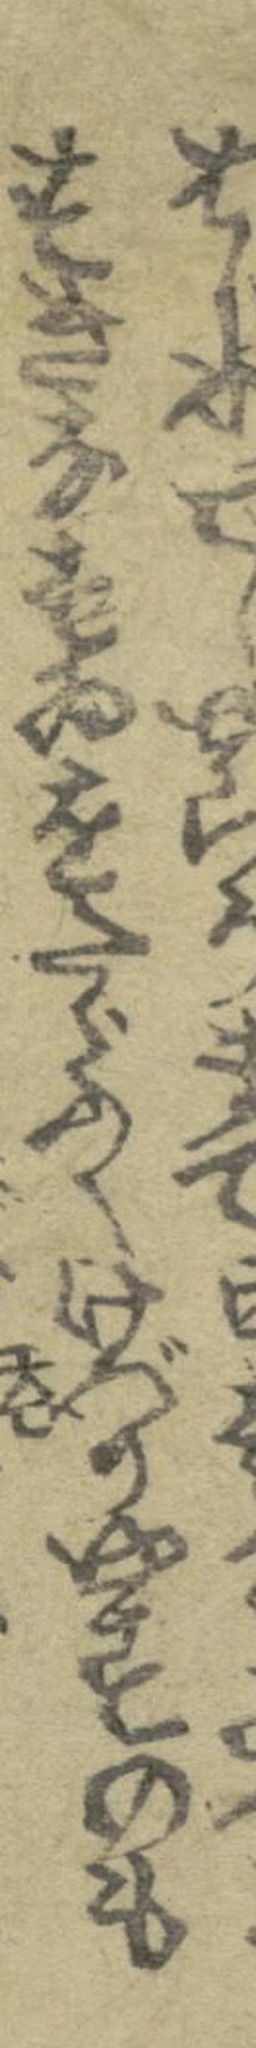すきなものをたらふくけづりやすのも
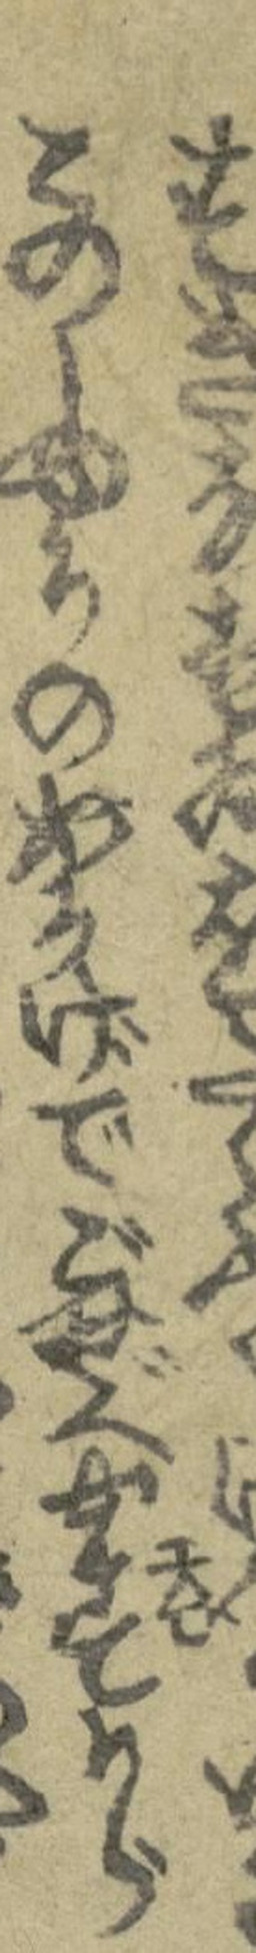このしゆうのおかげでごぜへやすから
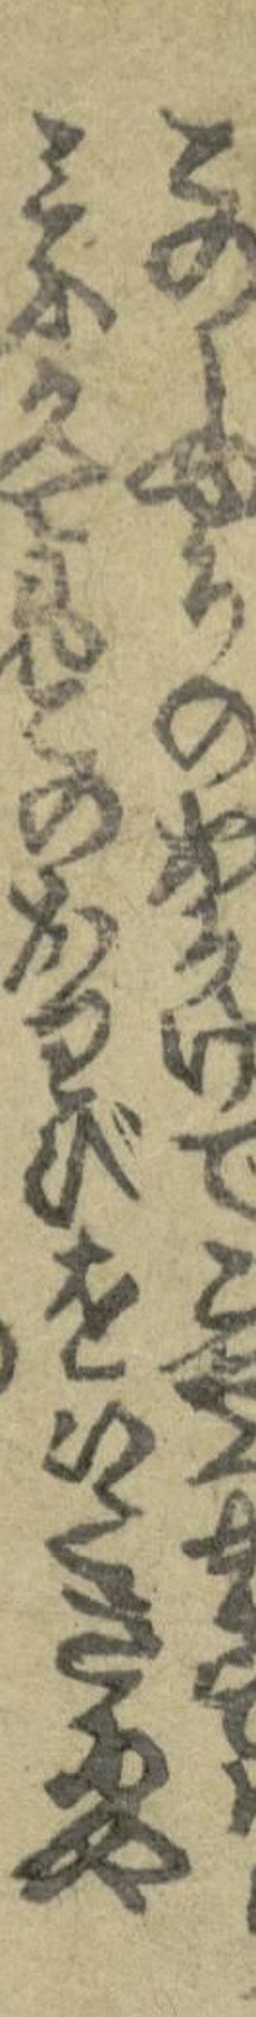みにかへてもこのおわびをいたさにや
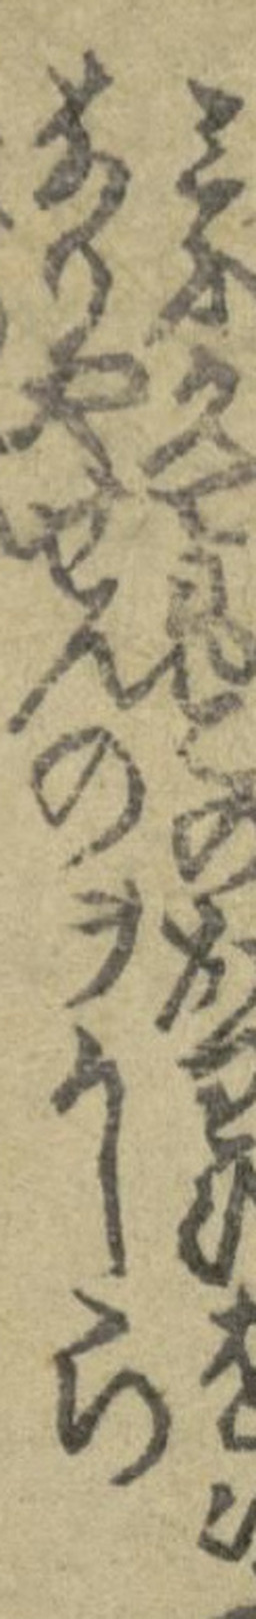なりやせんのヲかしら
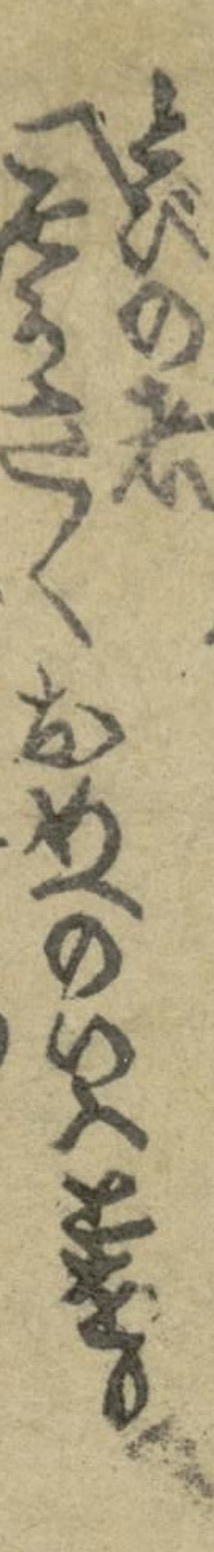〽そうさ〳〵おめへのいうとをり
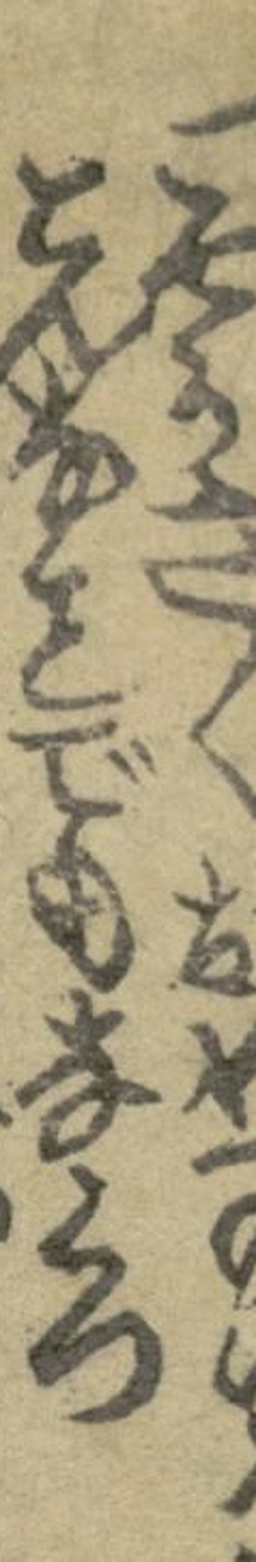こんなことでもなくつ
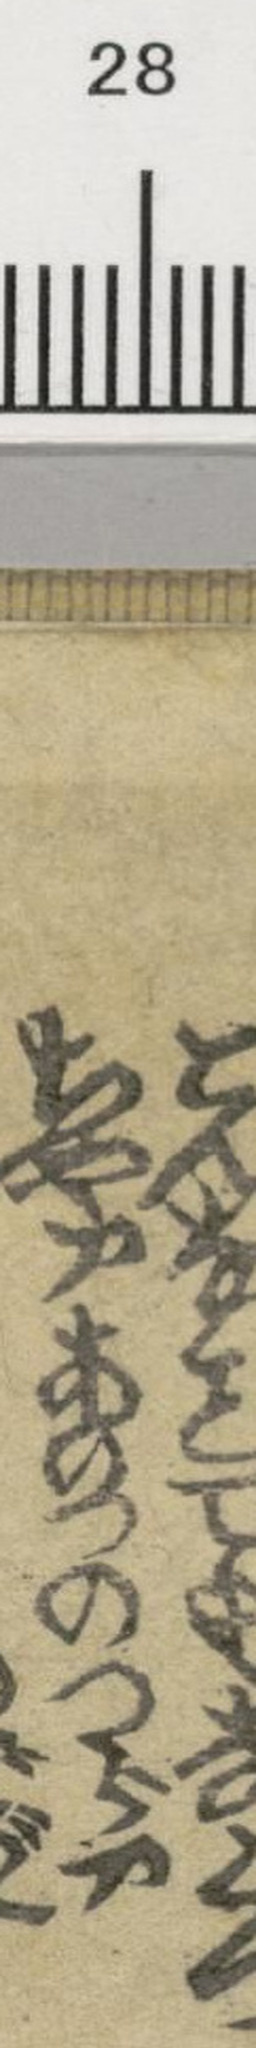ちやアあいつのつらア
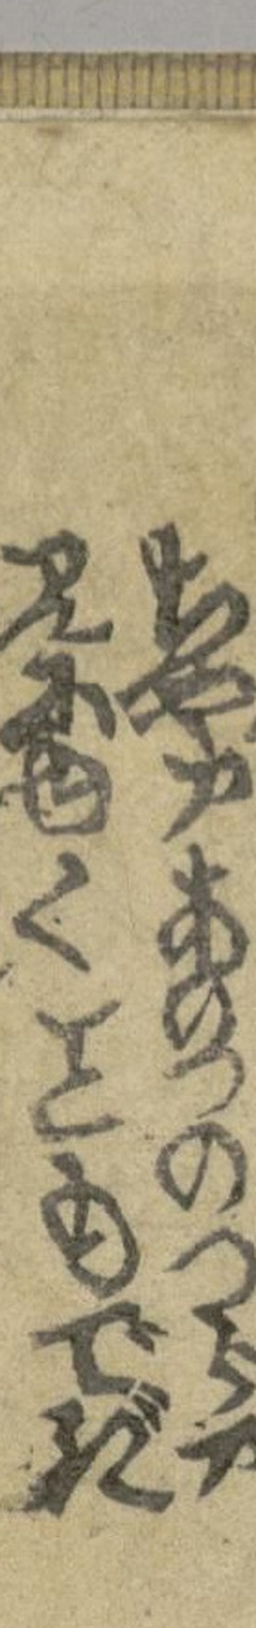みにゆくこともでき
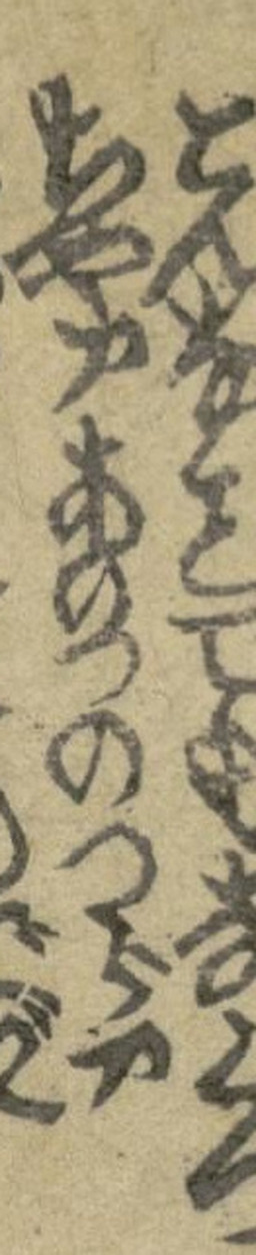ちやアあいつのつらア
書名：生捕ました三度の大地震
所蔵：東京大学地震研究所図書室 Earthquake Research Institute Library, The University of Tokyo, JAPAN
